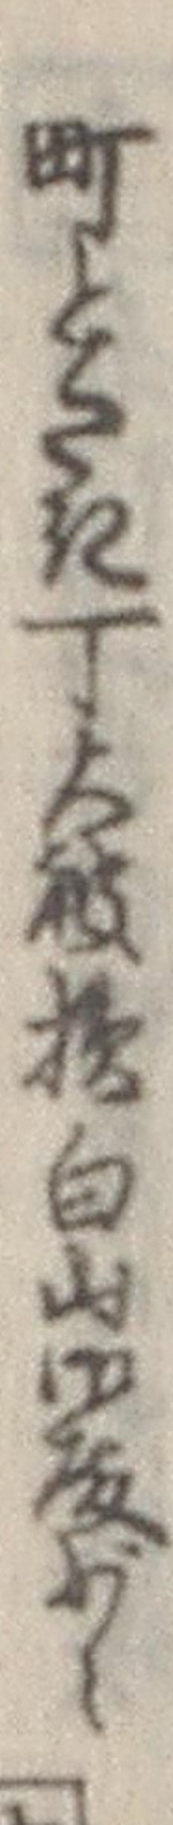町とさき丁大破損白山御殿少〻
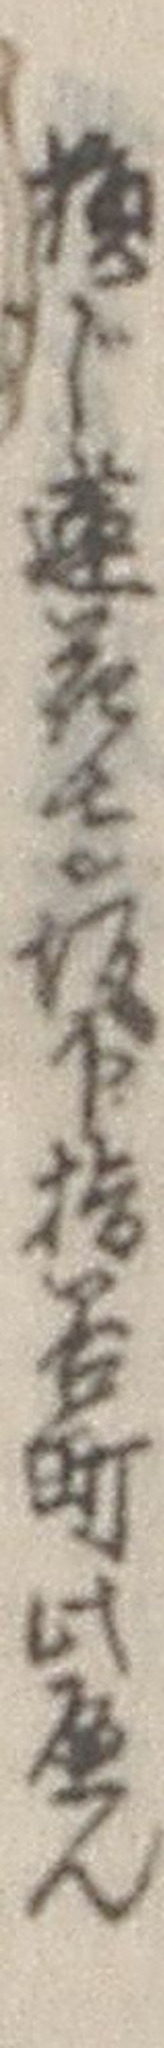損じ蓮花寺坂下指筈町此遍ん
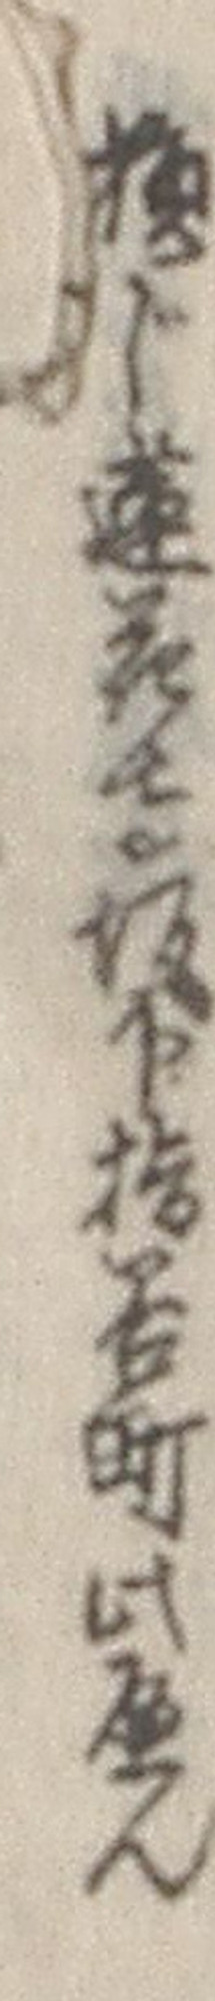損じ蓮花寺坂下指筈町此遍ん
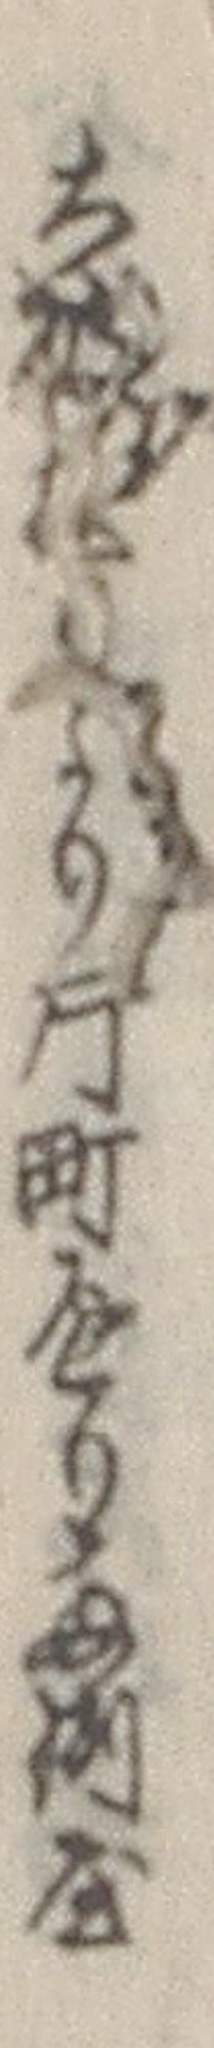大破損夫より万町通り両側屋
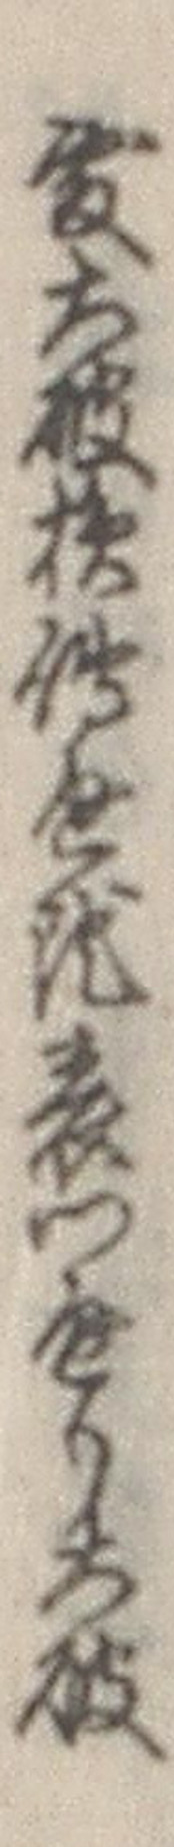敷大破損傳通院表門通り大破
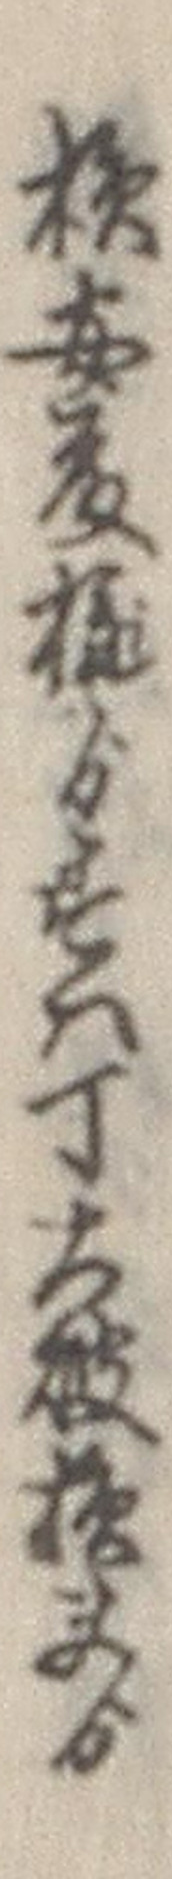損安藤様ゟすハ丁大破損夫ゟ
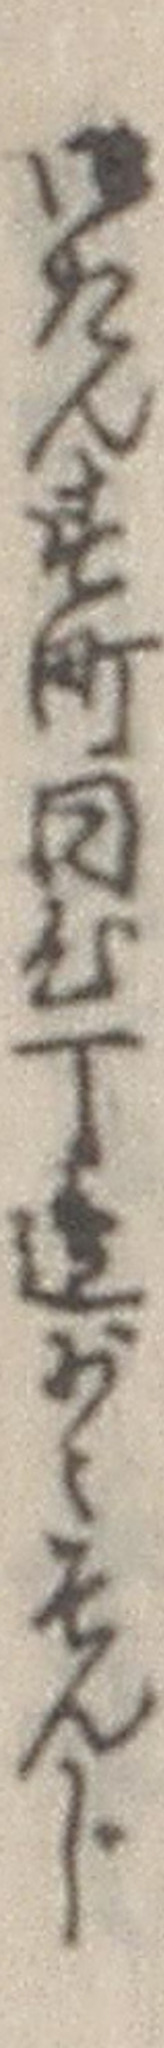御たんす町同登丁邊少〻そんじ
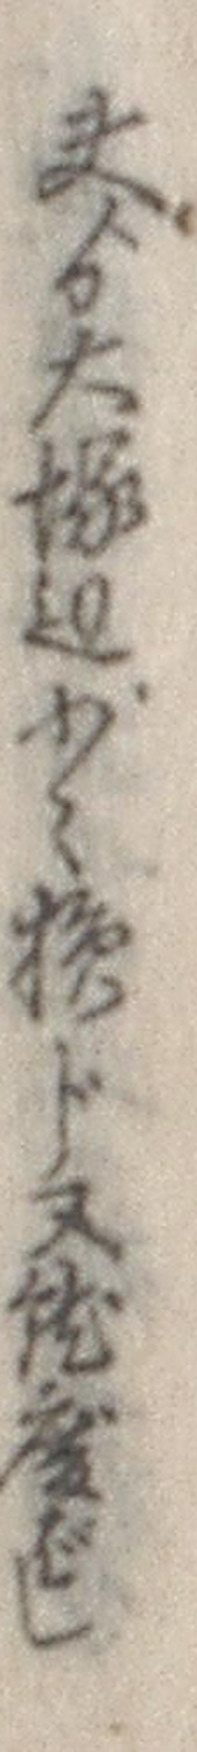夫ゟ大塚辺少〻損じ又就慶ばし
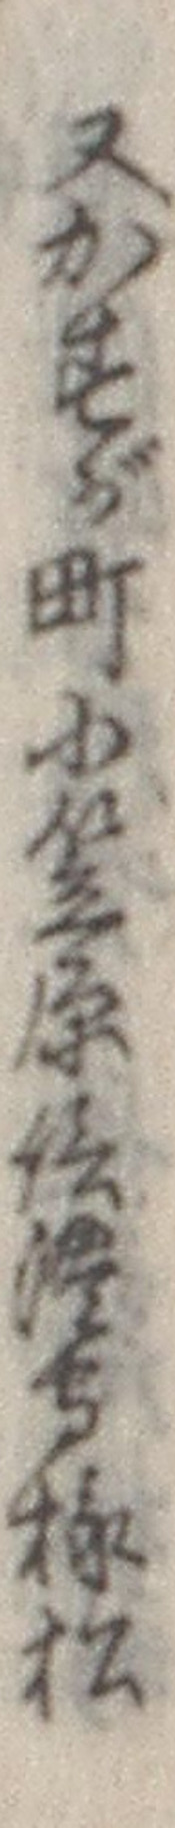又かすが町小笠原信濃守様松
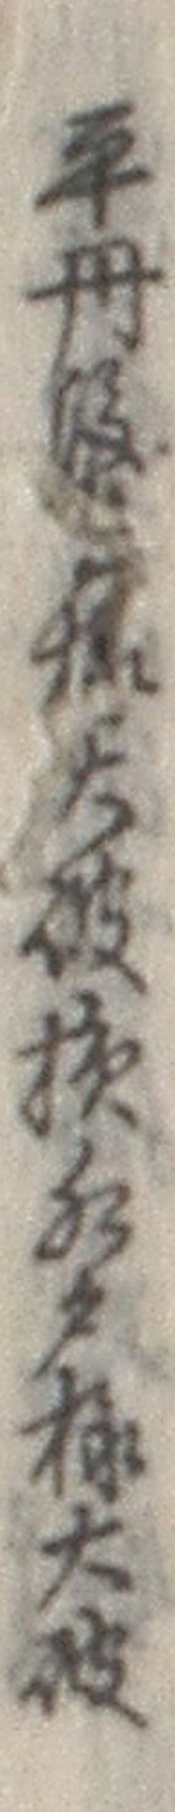平丹波守様大破損水戸様大破
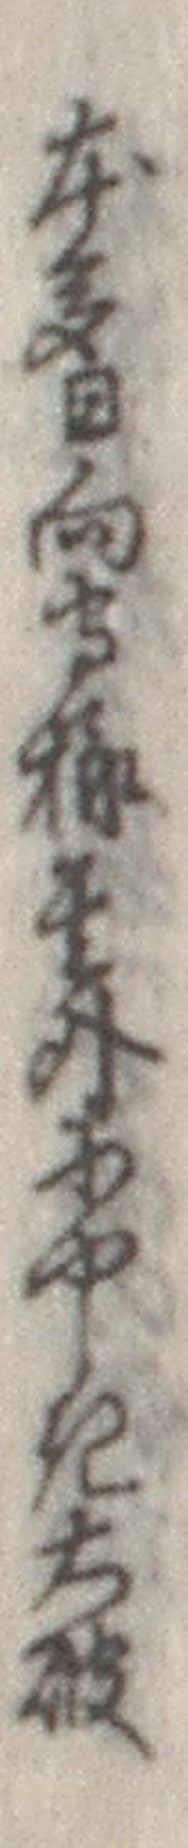本多日向守様其外にやしき大破
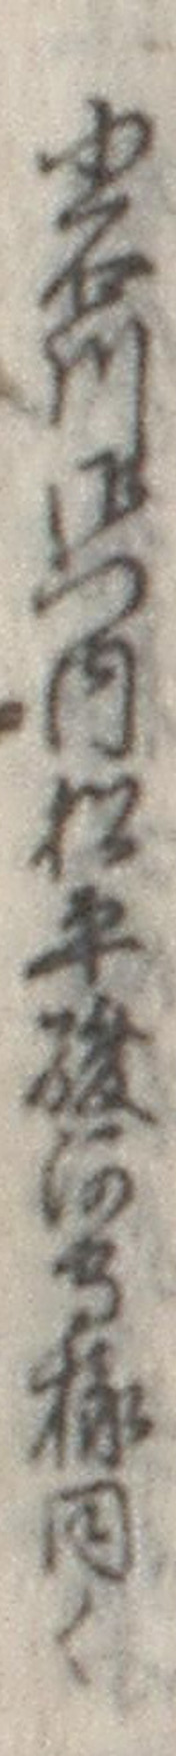小石川御門内松平駿河守様同く
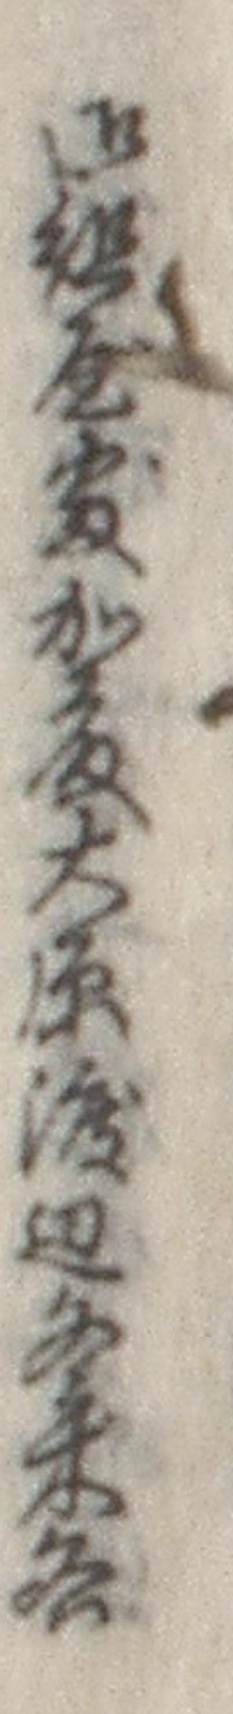御組屋敷加藤大源渡辺冬木各
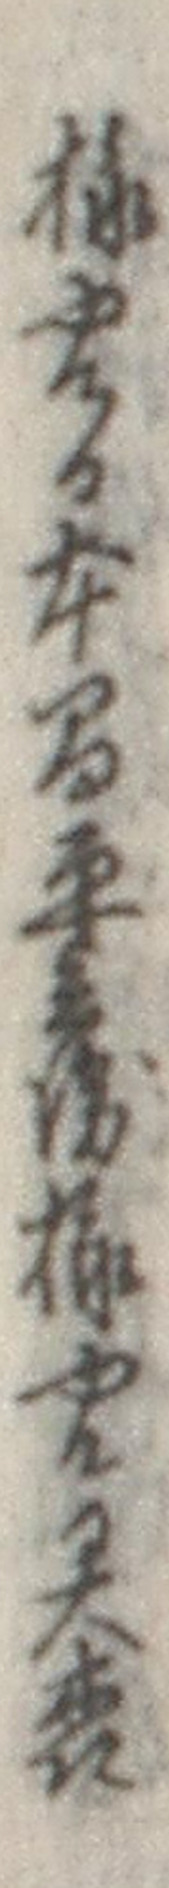様やける本間平兵衛様やける大森
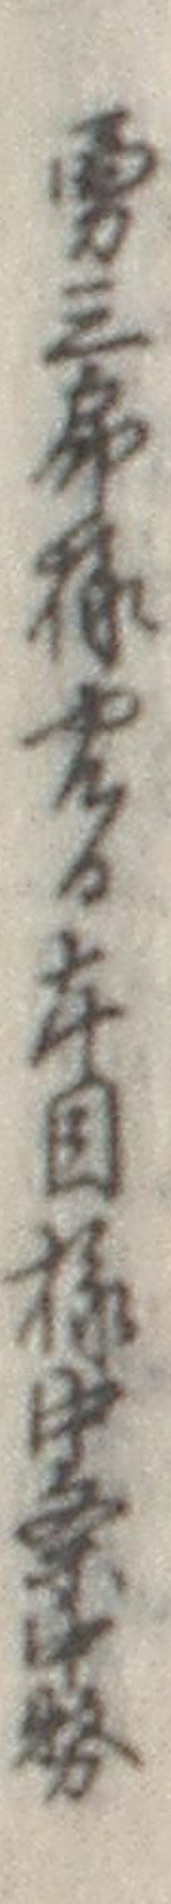勇三郎様やける本目様中条中務
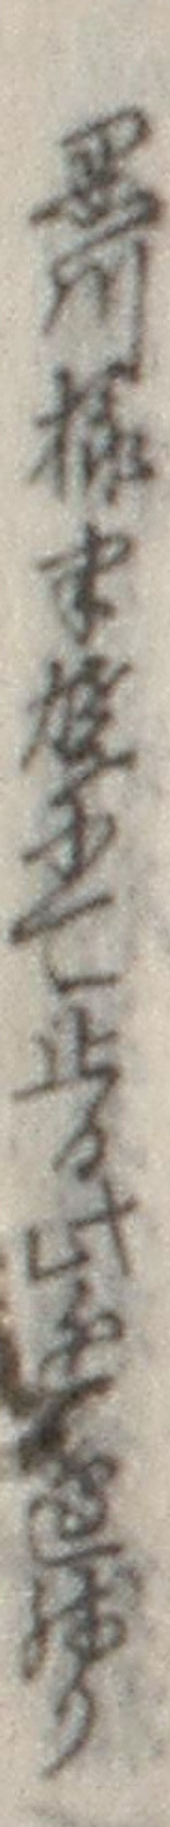黒川様半焼にて止る此近邊残り
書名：江戸　大地震臣細録　全
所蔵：東京大学地震研究所図書室 Earthquake Research Institute Library, The University of Tokyo, JAPAN
